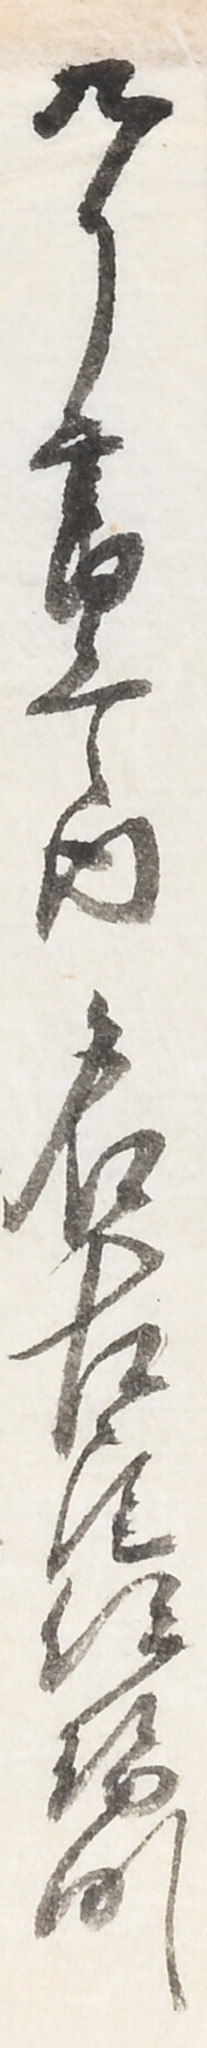九月書上之内名古屋伊勢町
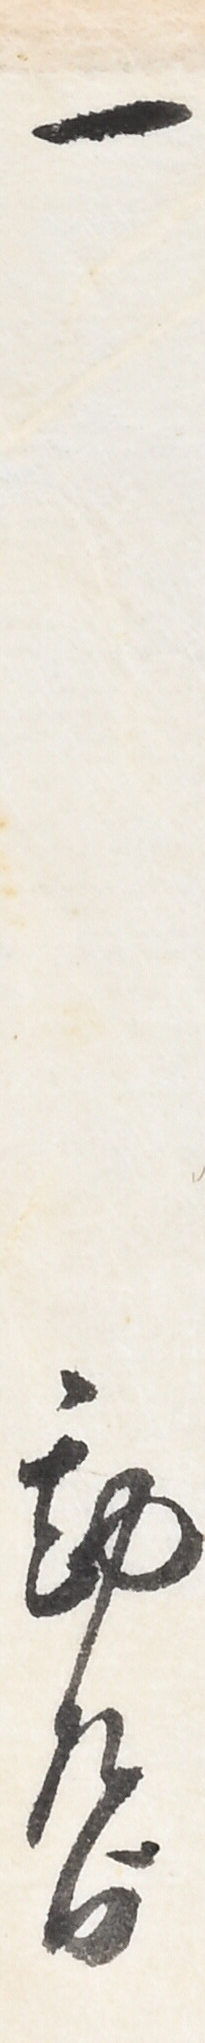一勘左衛門
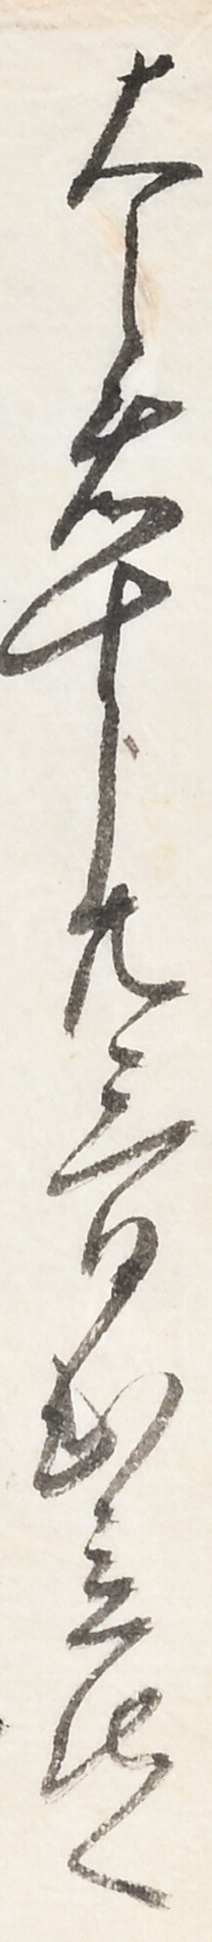右之者十月廿三日出立仕候
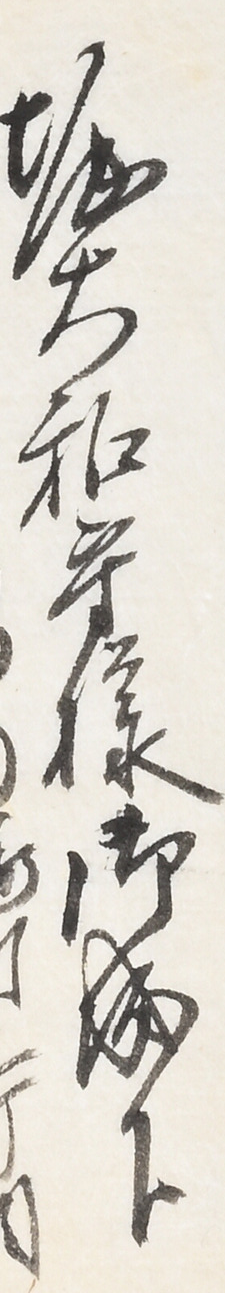堀大和守様御城下
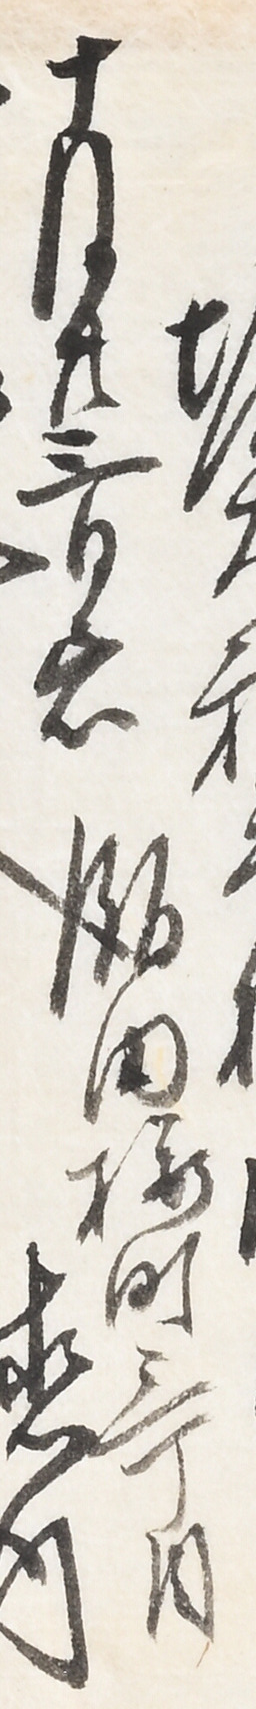十月廿三日着飯田桜町三丁目
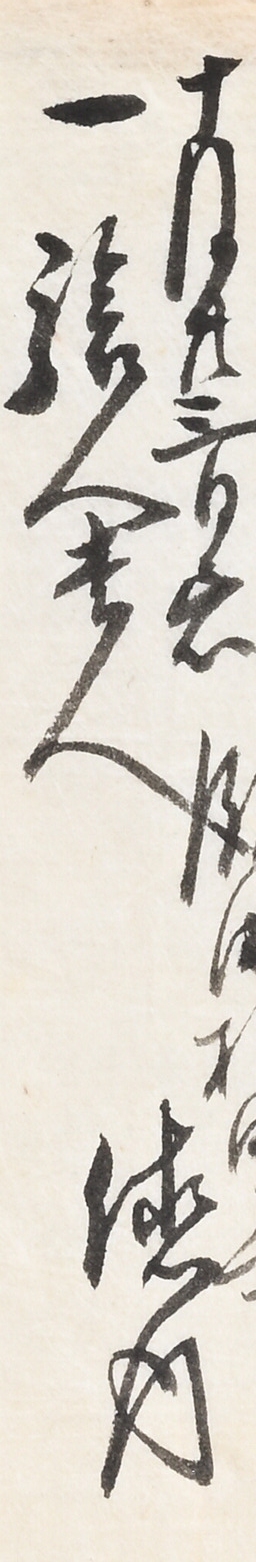一旅人壱人徳内
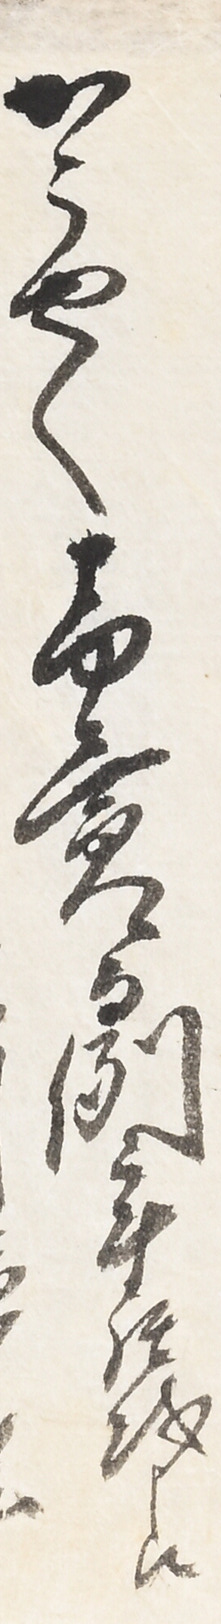かうやく商売ニ而例年罷越申候
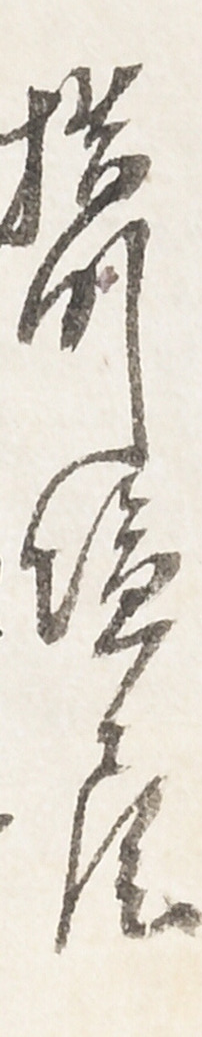横町塩屋
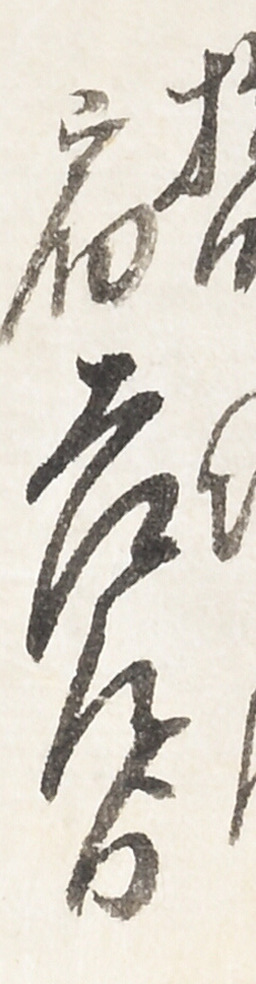宿吉左衛門
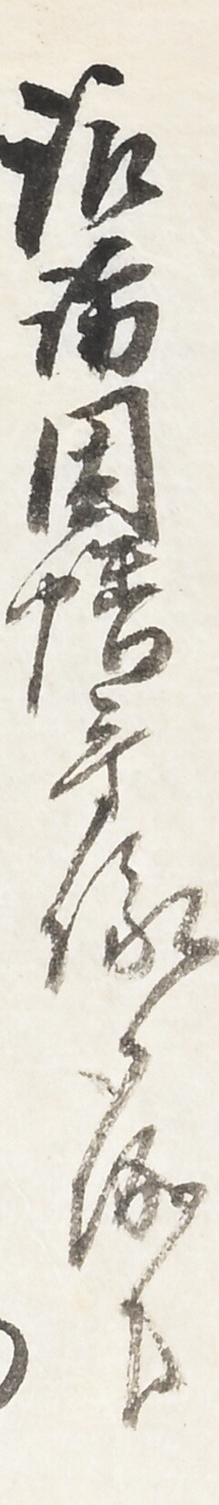諏訪因幡守様御城下
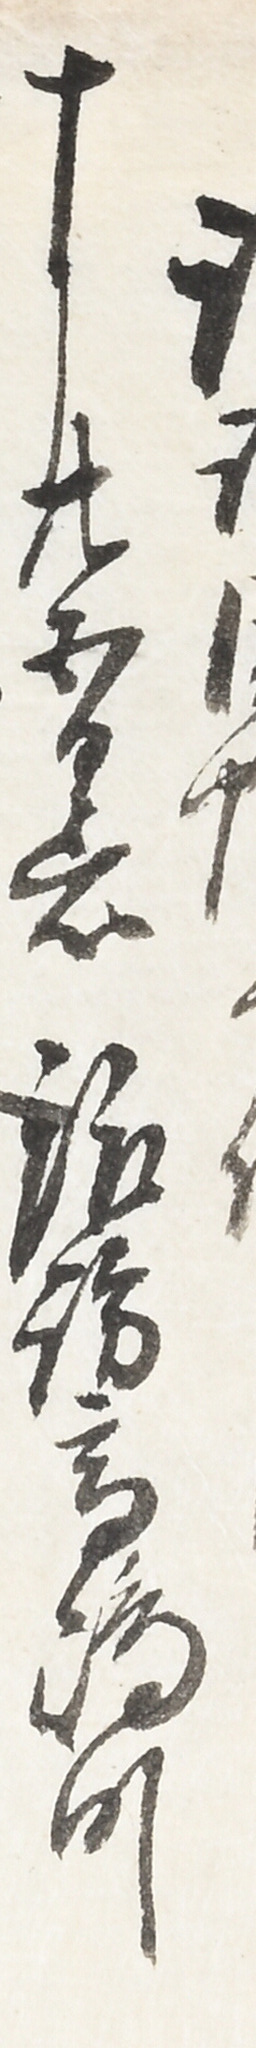十月廿五日着諏訪高嶋町
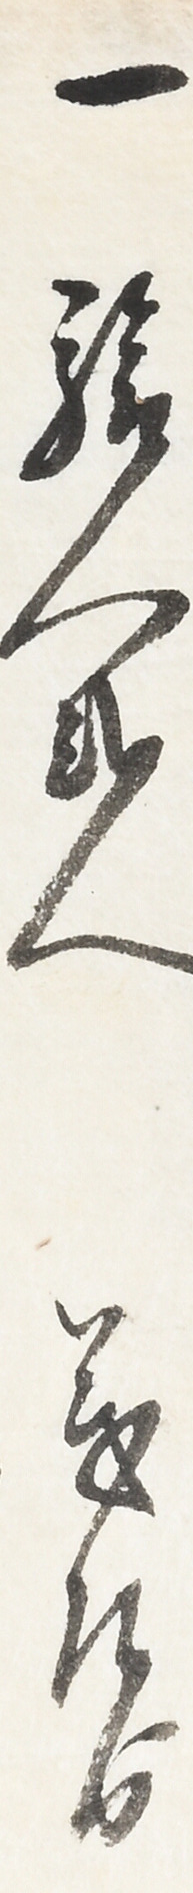一旅人弐人義左衛門
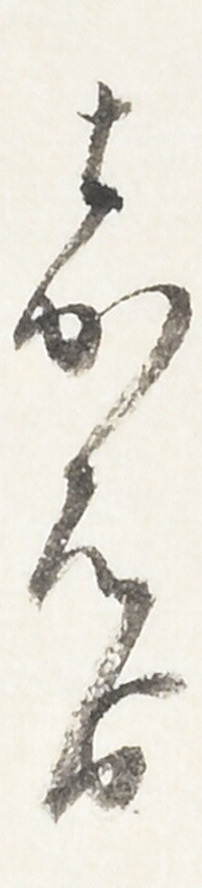喜右衛門
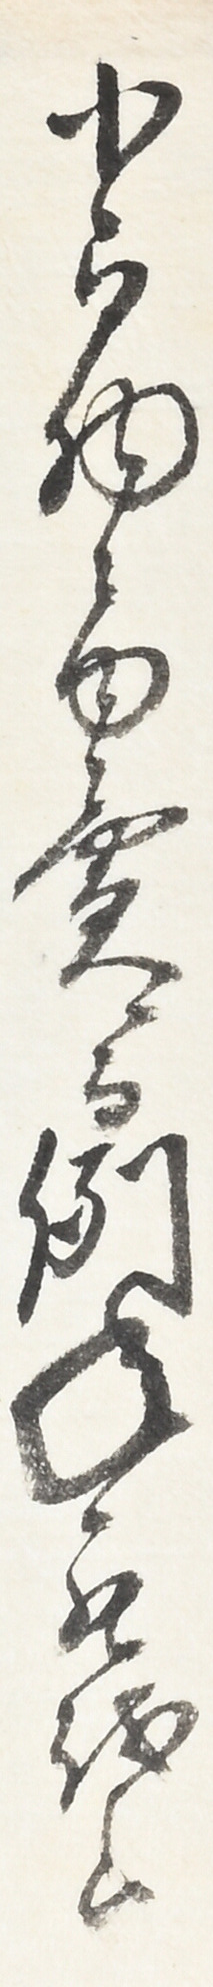小間物商売ニ而例年罷越申候
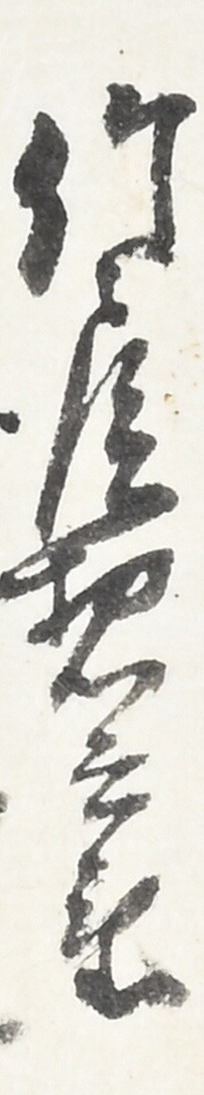竹屋惣兵衛
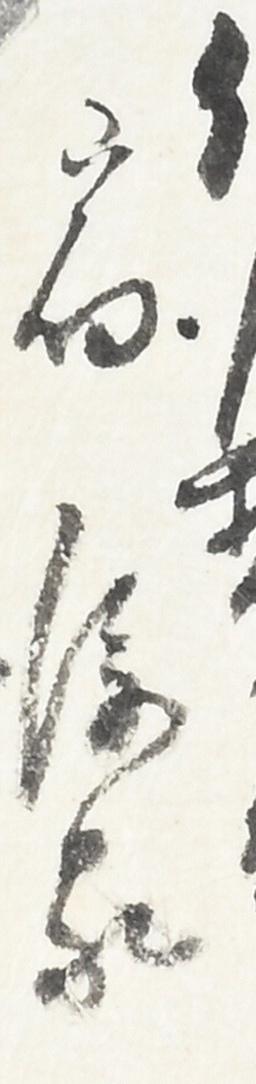宿後家
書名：旅人泊控帳
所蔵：伊那市立高遠町図書館・合同会社AMANE
